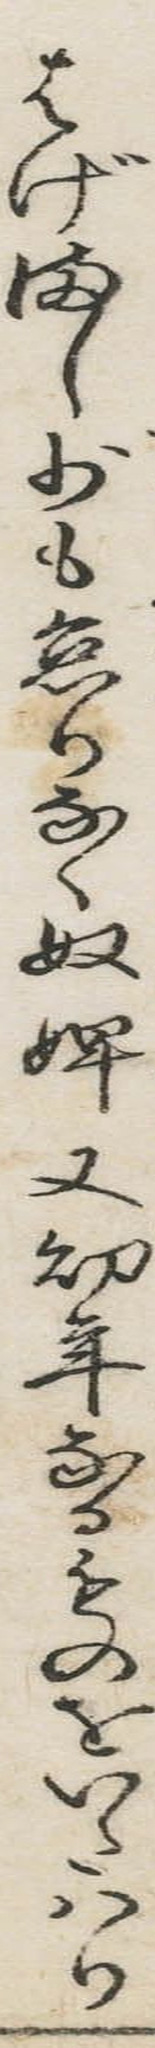はげまし少も怠りなく奴婢又幼年なるものをいたはり
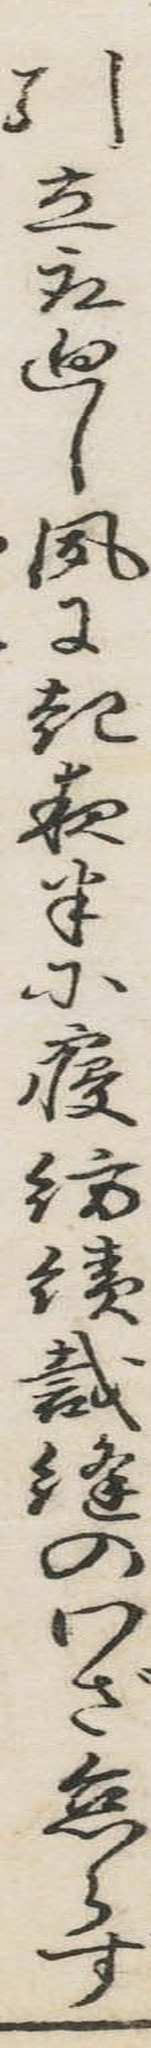引立取廻し夙に起夜半に寝紡績裁縫のわざ怠らず
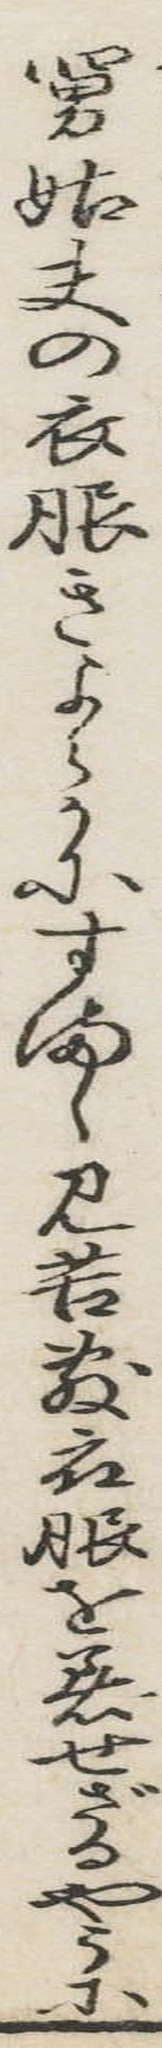舅姑夫の衣服きよらかにすへし見苦敷衣服を着せざるやうに
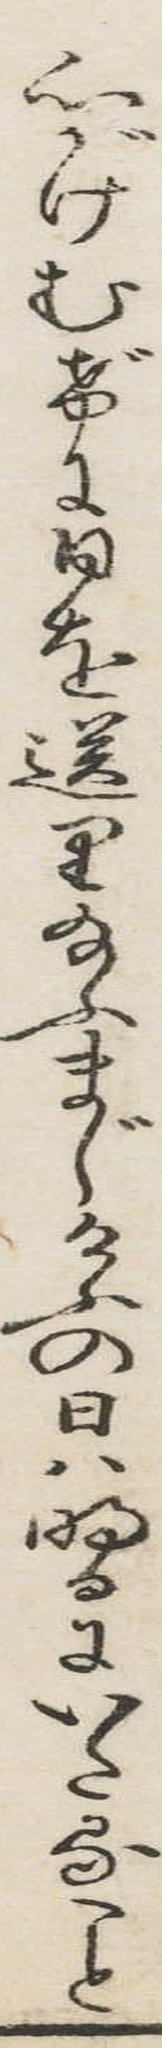心がむげに日を送り給ふまじけふの日は明日にいたること
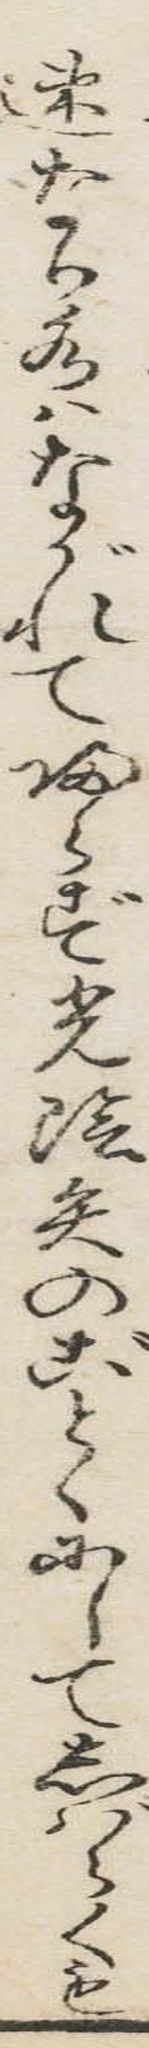速なる水はながれて帰らず光陰矢のごとくにしてしばらくも
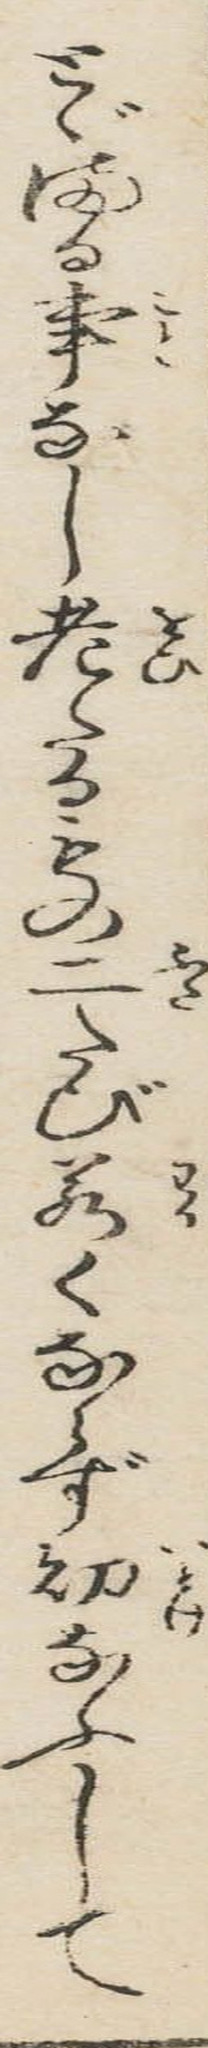どゞまる事なし老たるもの二たび若くならず幼なふして
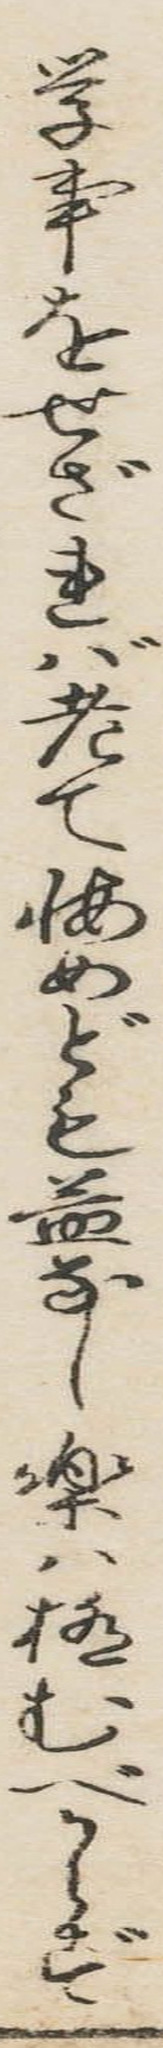学事をせざれば老て悔めども益なし楽は極むべからず
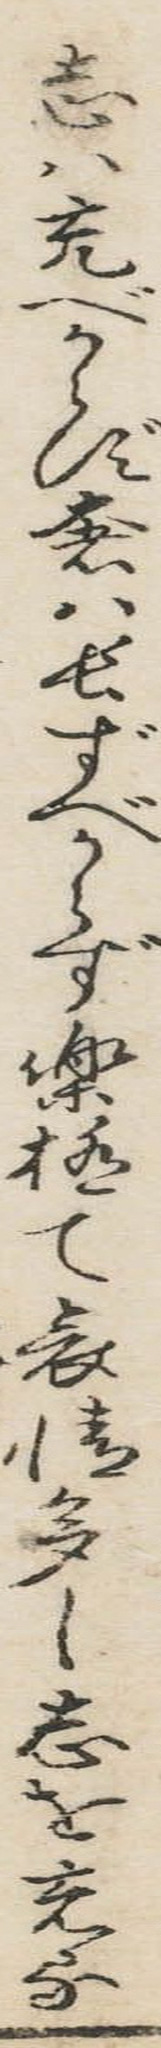志は充べからず奢は長ずべからず楽極て哀情多し志を充る
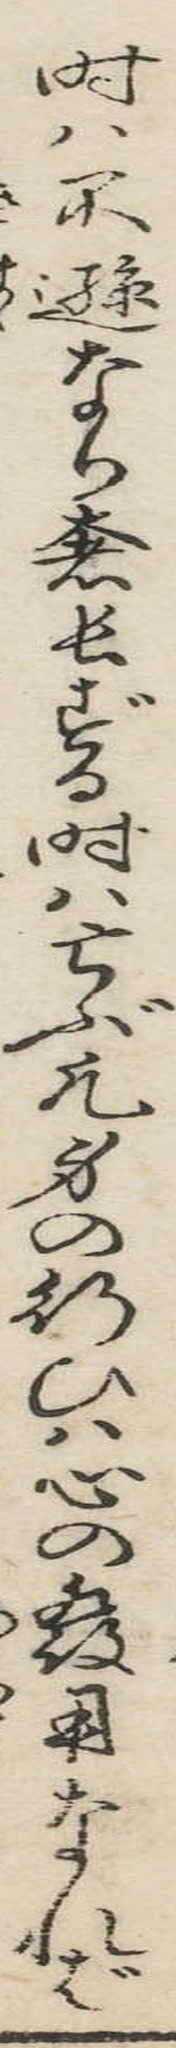時は不遜なり奢長ずる時は亡ぶ凡身の行ひは心の発用なれば
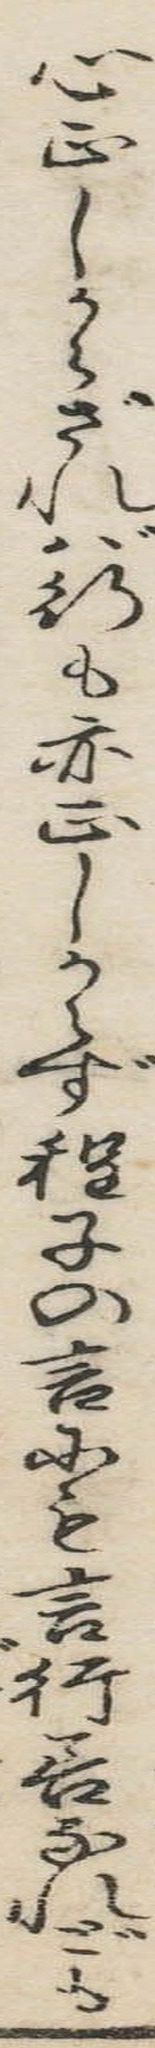心正しからざれば行も亦正しからず程子の言にも言行善なれども
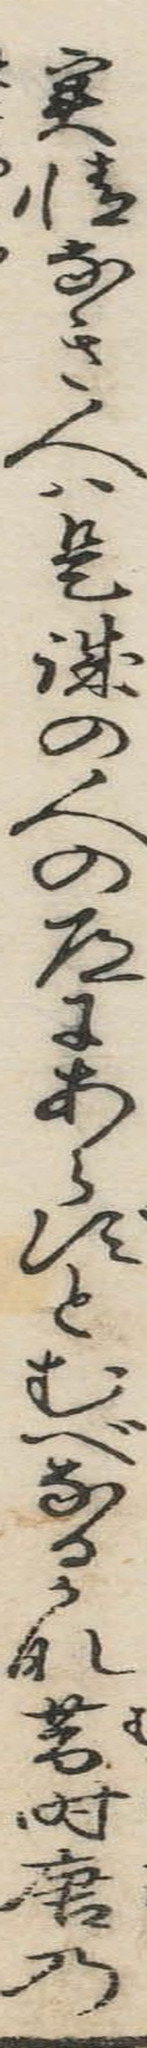実情なき人は是誠の人の道にあらずとむべなるかな昔時唐の
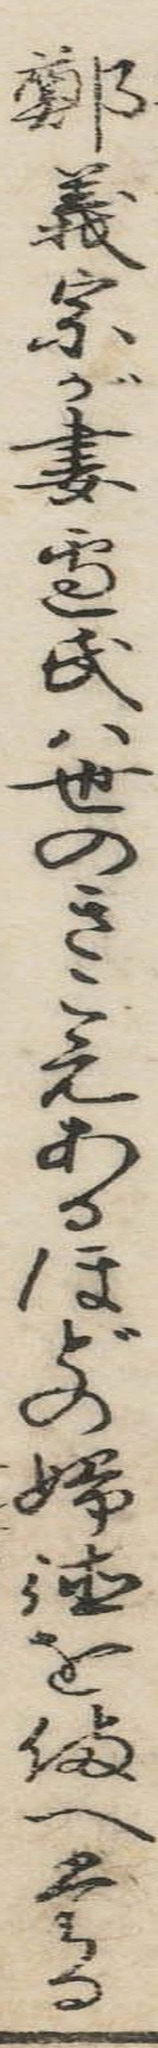鄭義宗が妻盧氏は世のきこえあるほどの婦徳を備へたる
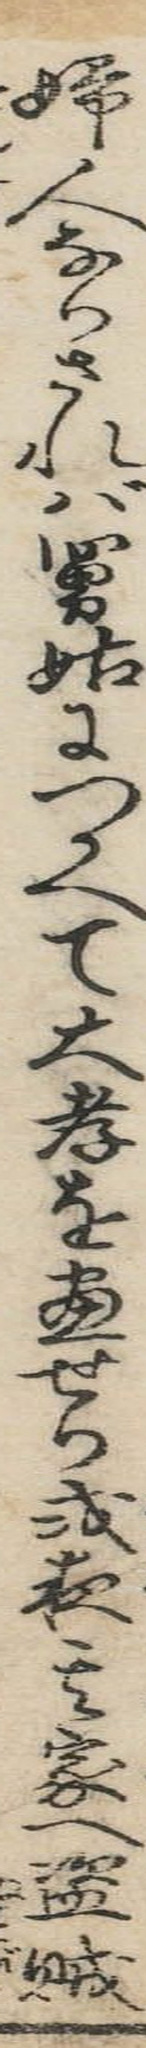婦人なりされば舅姑につかへて大孝を尽せり或夜其家へ盗賊
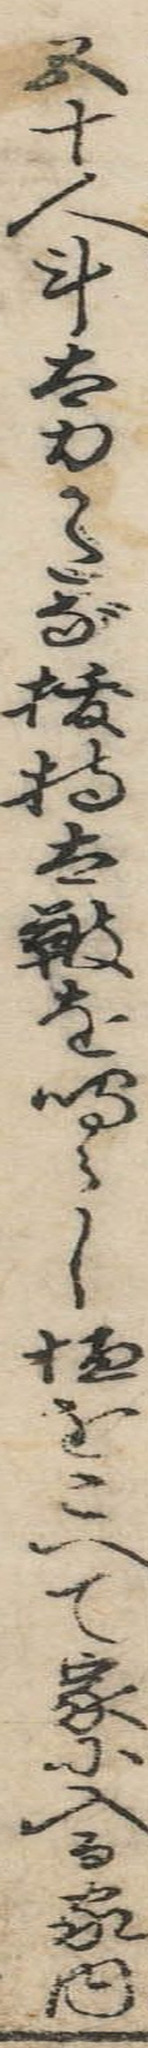五十人計太刀かたな抜持太鼓を鳴らし垣をこへて家に入る家内
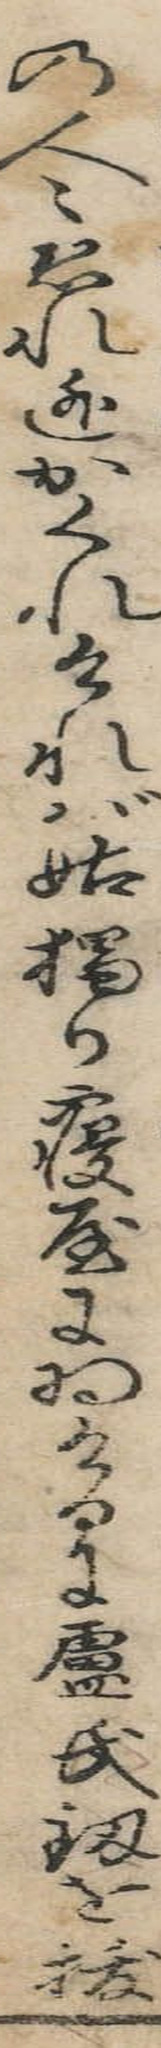の人々恐れ逃かくれければ姑独り寝屋にゐけるに盧氏釼を抜

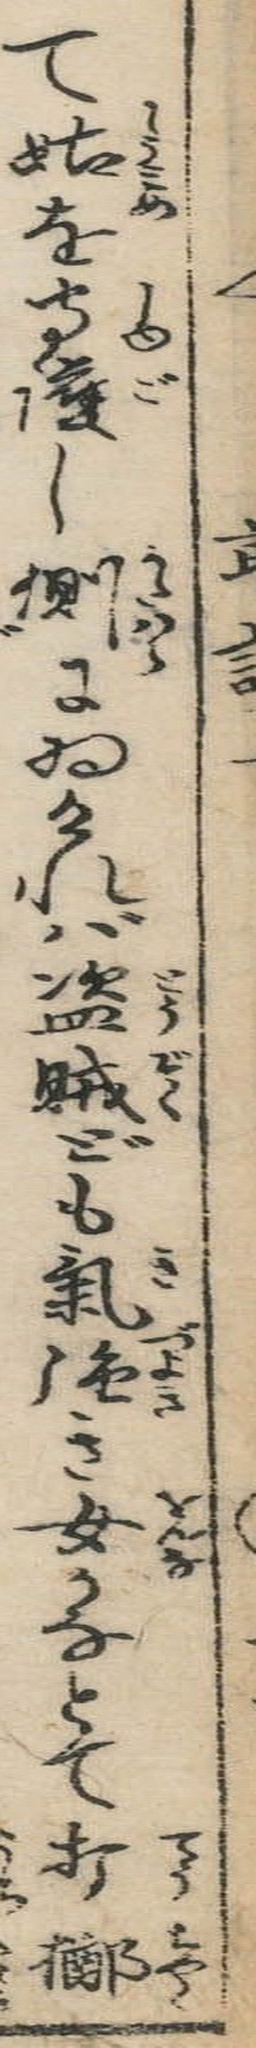て姑を守護し側にゐければ盗賊ども気強き女かなとて打擲
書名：前訓
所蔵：東京学芸大学附属図書館
